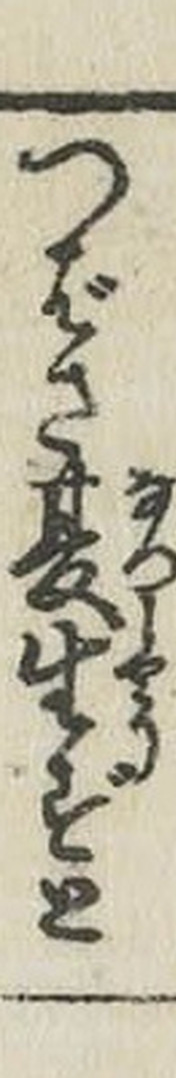つばさ夏生ずと
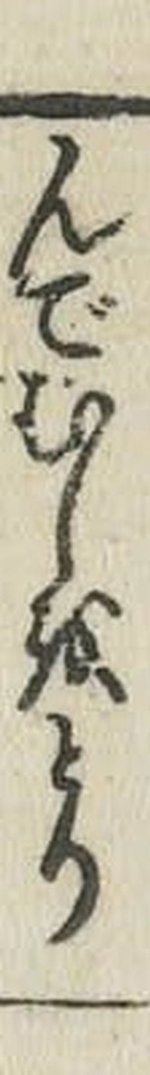んでむしをとり
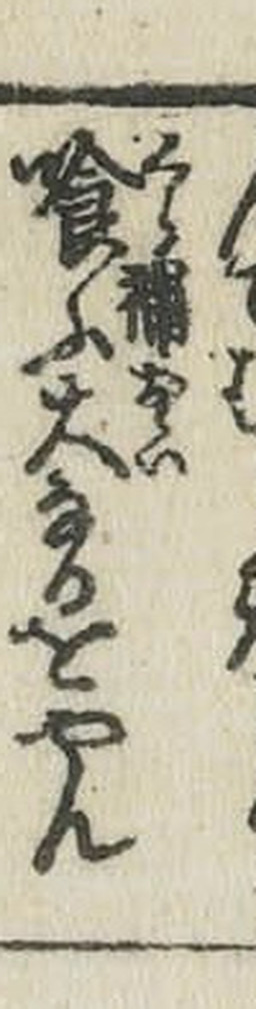喰ふ大なるをやん
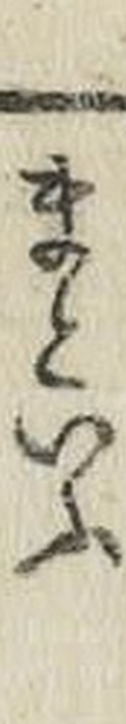まといふ
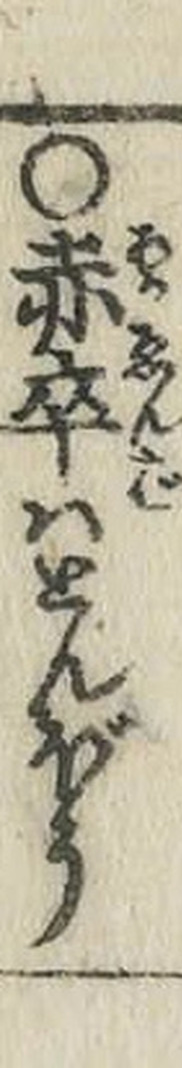○赤卒はとんぼう
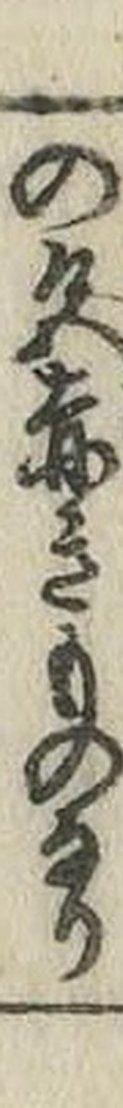の色赤きものなり
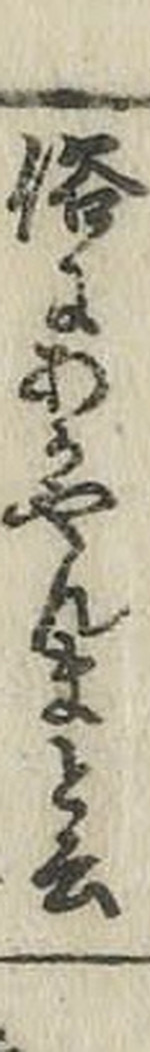俗にあかやんまと云
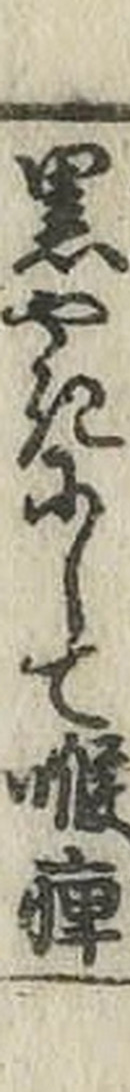黒やきにして喉痺
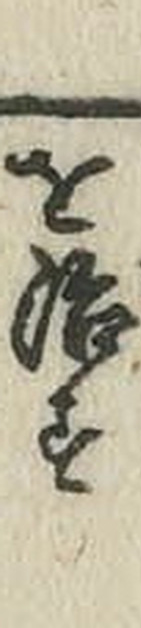を治す
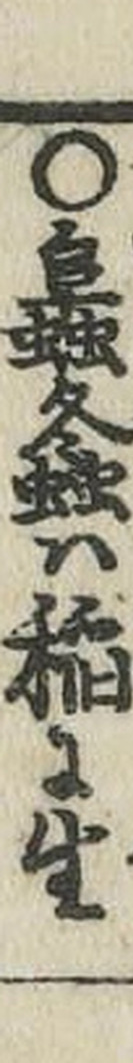○䘀螽は稲に生
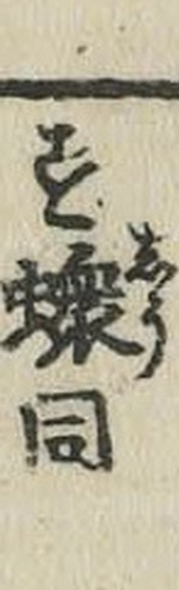す𧑄同
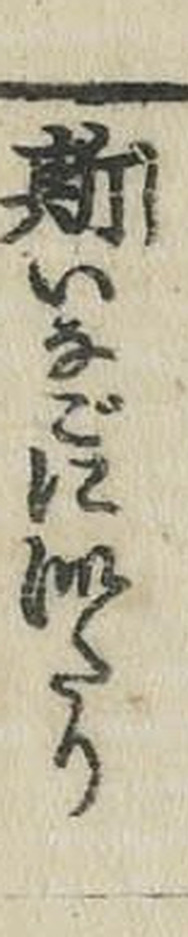斯いなごに似たり

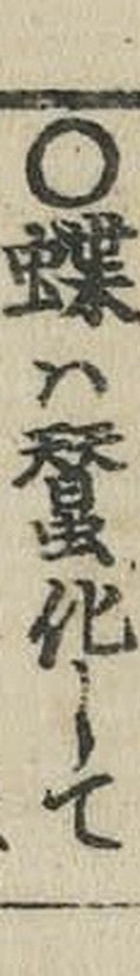蝶は蠺化して
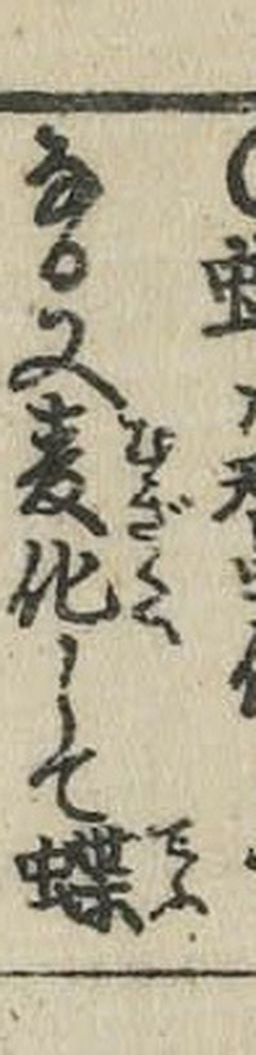なる又麦化して蝶
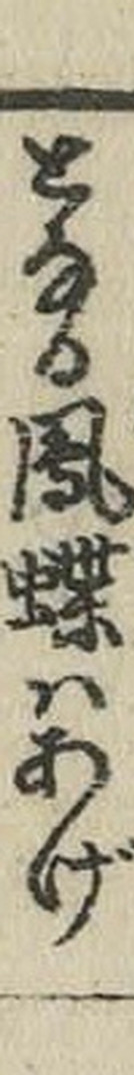となる鳳蝶はあげ
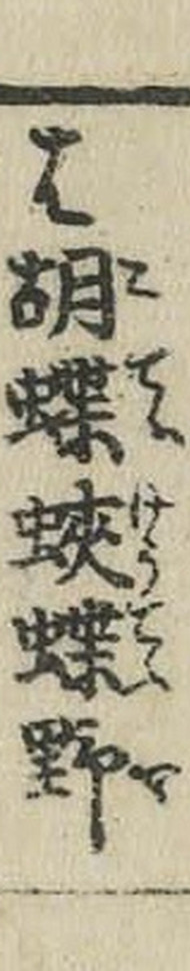は胡蝶蛺蝶野
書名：増補頭書訓蒙図彙大成 10巻 7:巻之14-16
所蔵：東京学芸大学教育コンテンツアーカイブ
